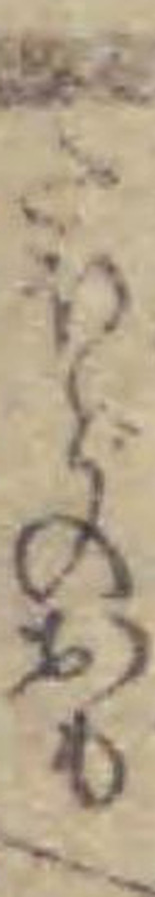さほどのおも
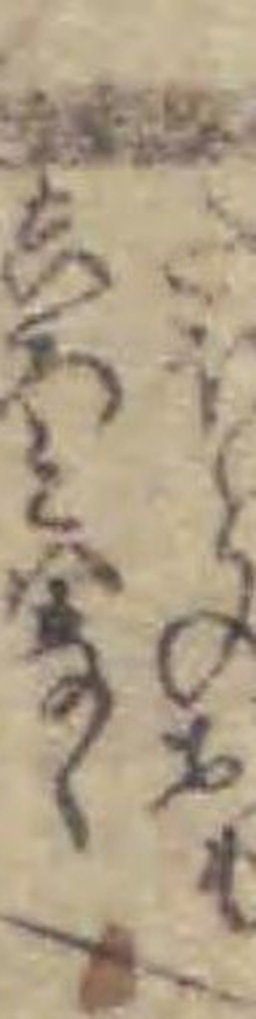しろみはなく
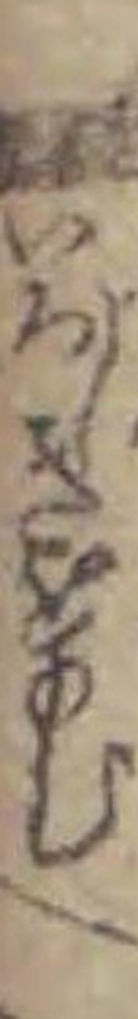いろ〳〵きをもむ
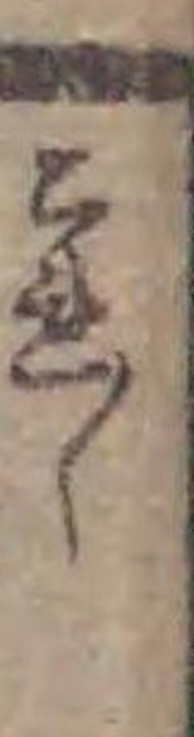これ〳〵
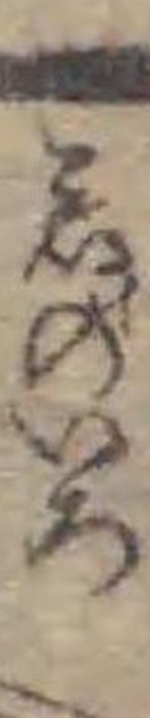昔のいろ
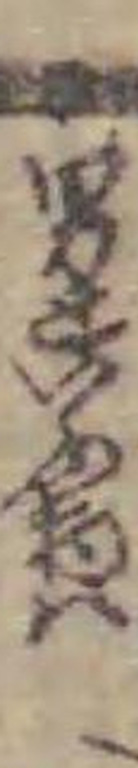男といふ物は
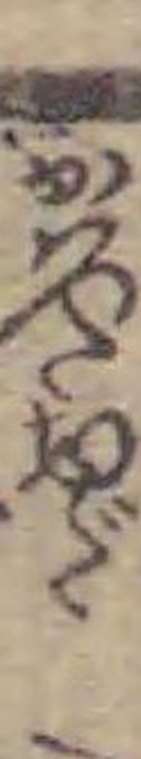かはつた物だ
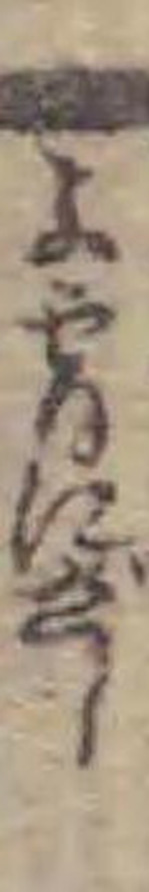よ宵にざし
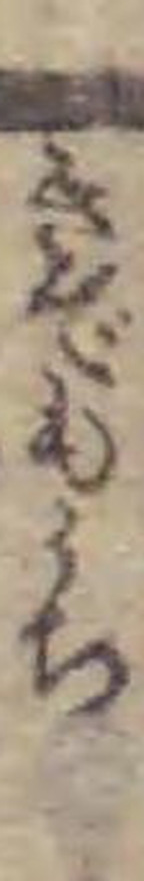きでもうち
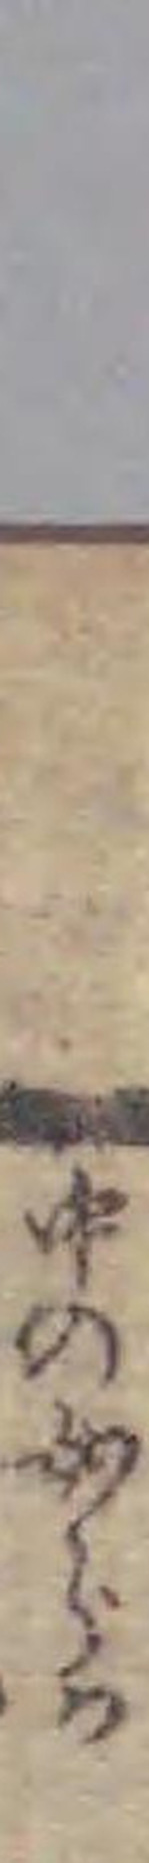中の女郎か
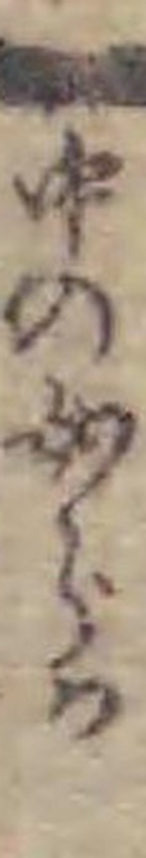中の女郎か
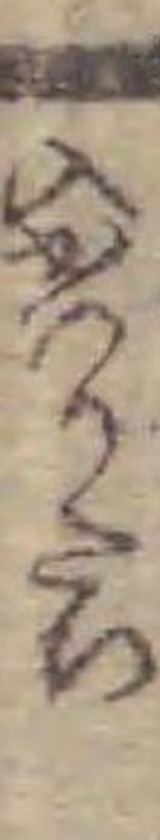入れかはりたち
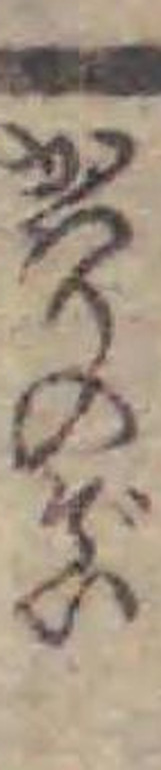かはりのぞい
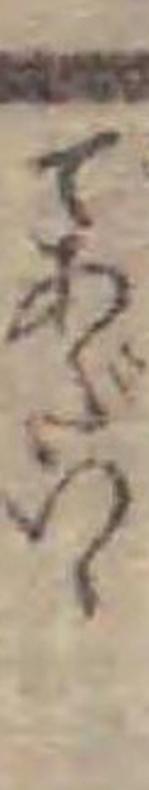てあだいゝ
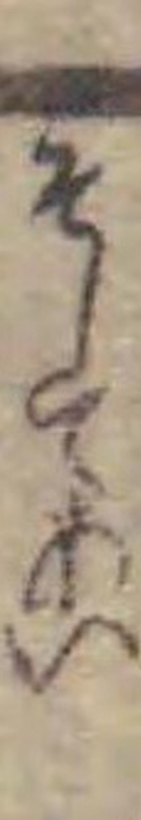そしてあい
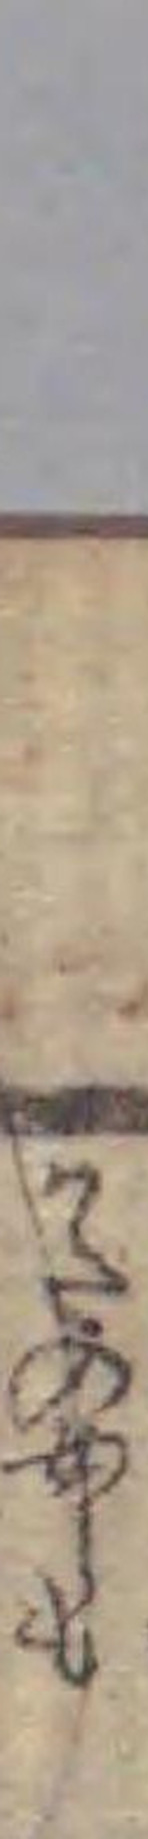かたの女郎も
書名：通風伊勢物語 : 3巻
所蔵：国立国会図書館 National Diet Library, JAPAN
